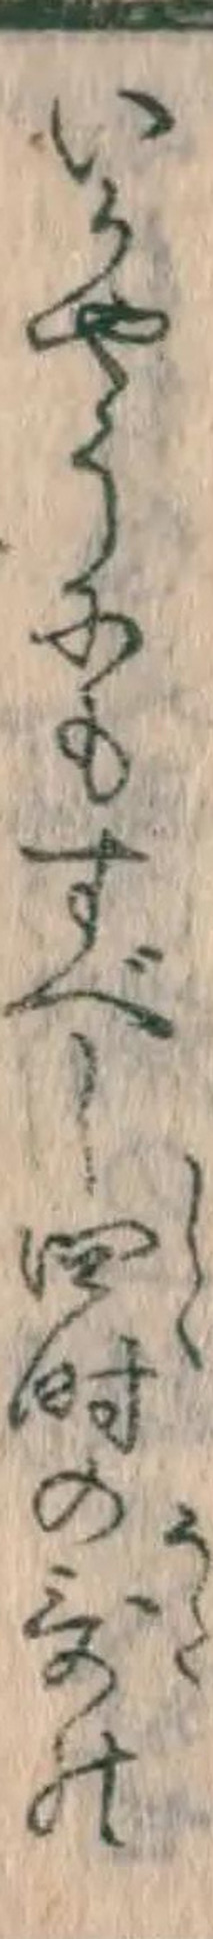いかやうにもすべし四時の歌の
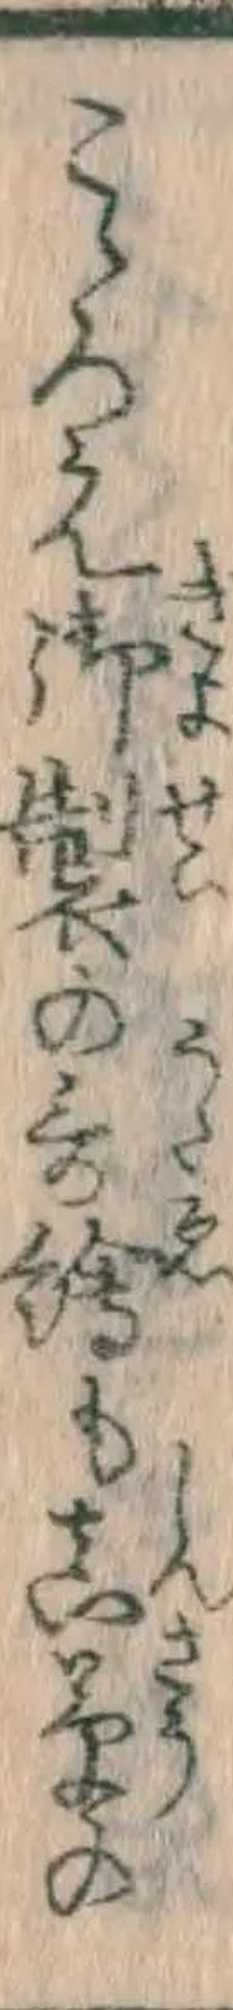こゝろえ御製の歌絵も真草の
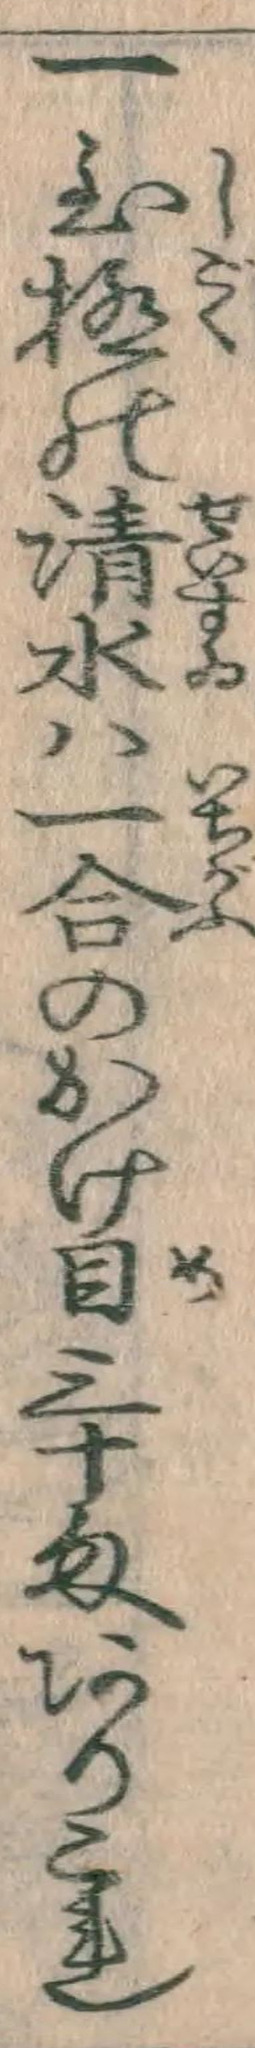一至極の清水は一合のかけ目三十匁ありこれ
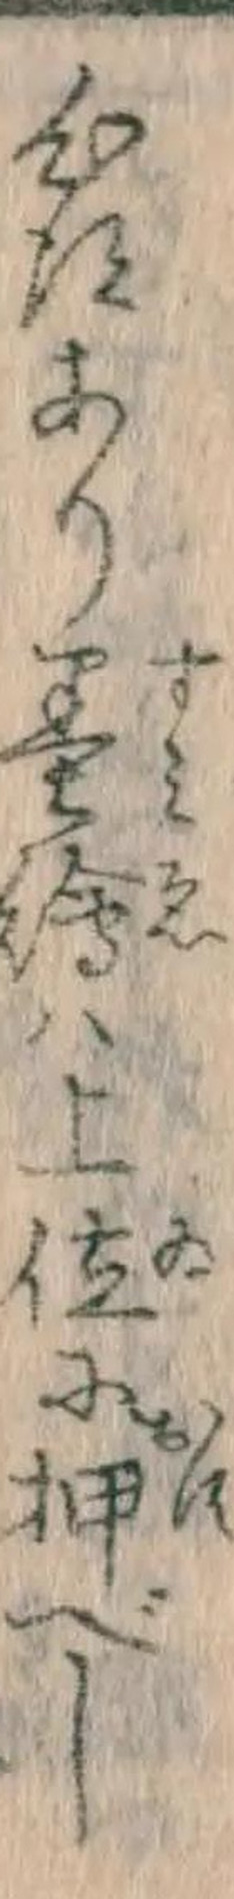心得あり墨絵は上位に押べし
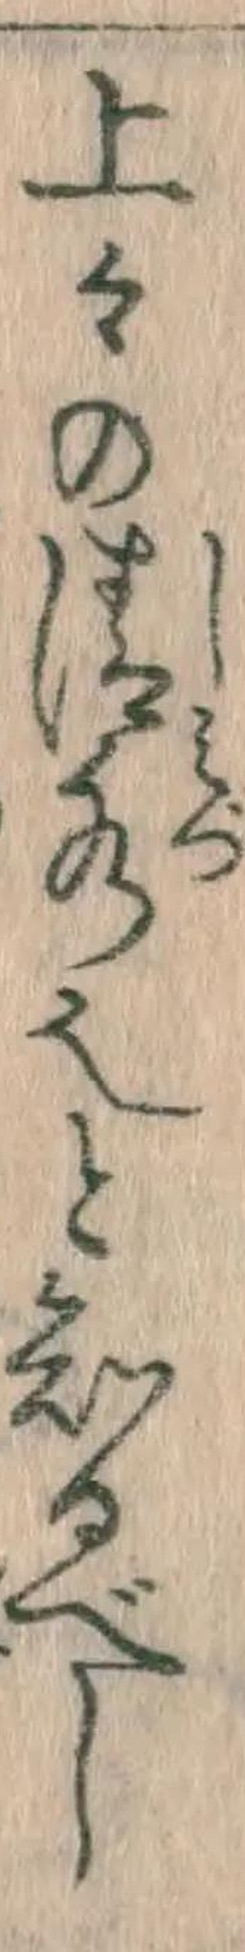上々の清水也と知るべし
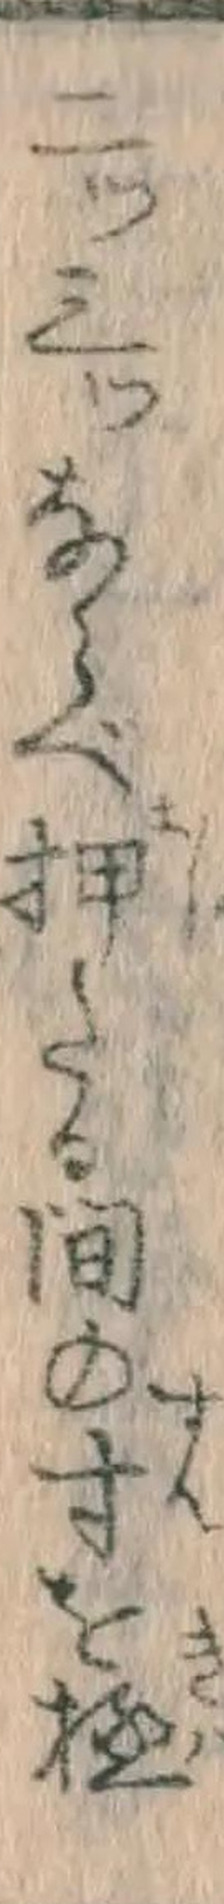二ッ三ッならべ押たる間の寸を極
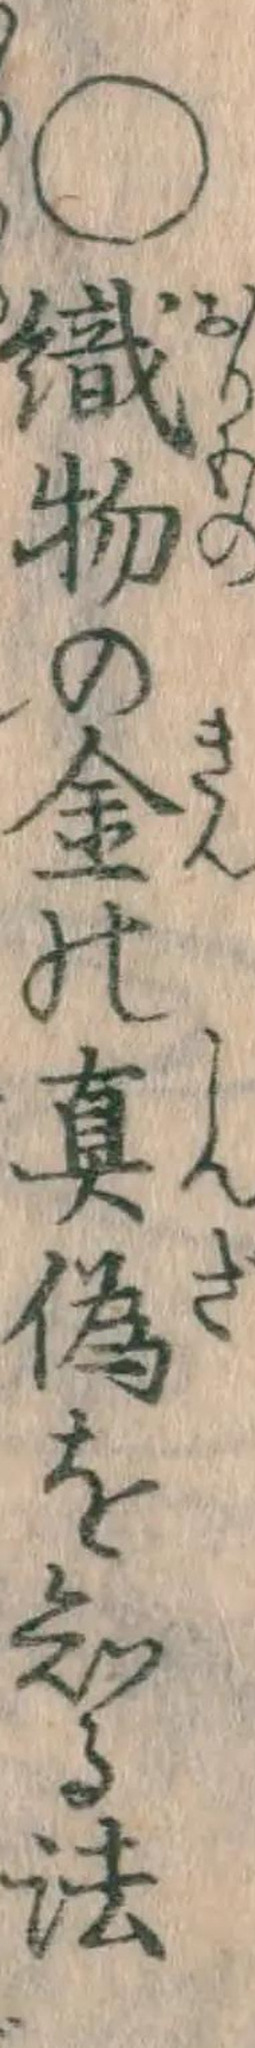○織物の金の真偽を知る法
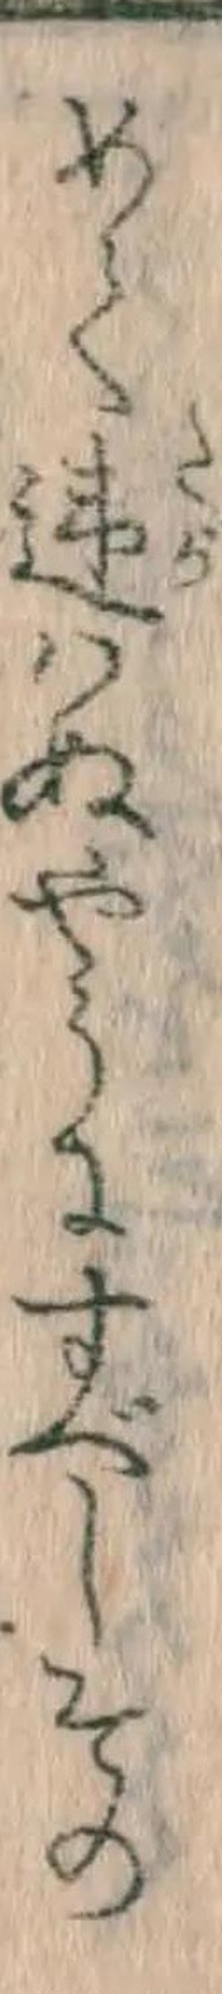めて違はぬやうにすべしその
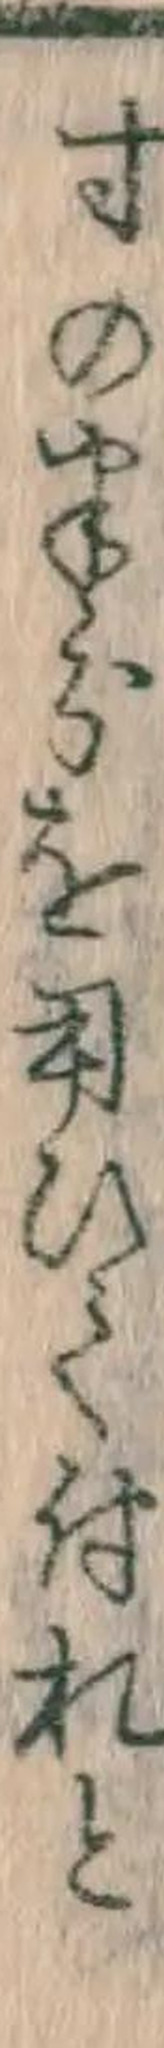寸の半分を用ひて付札と
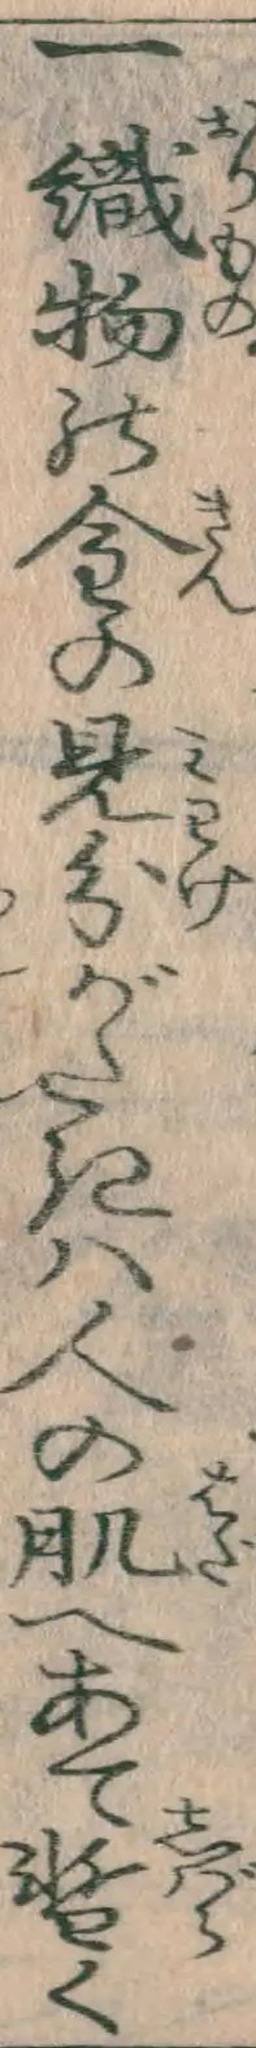一織物の金の見分がたきは人の肌へあて暫く
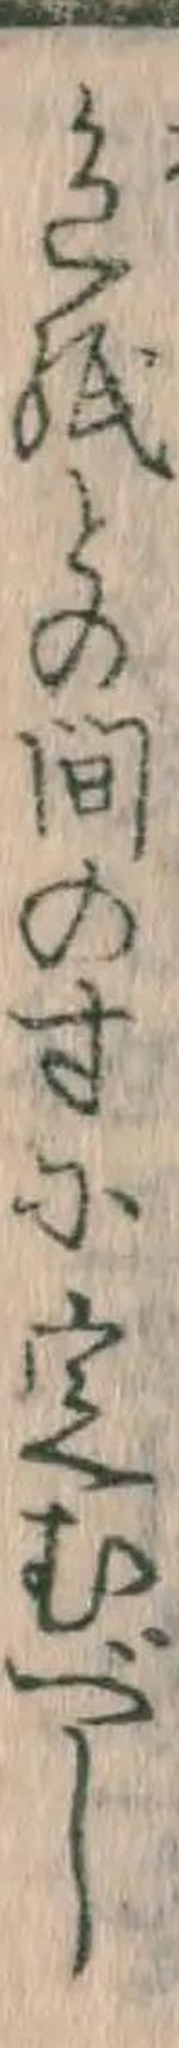色紙との間の寸に定むべし
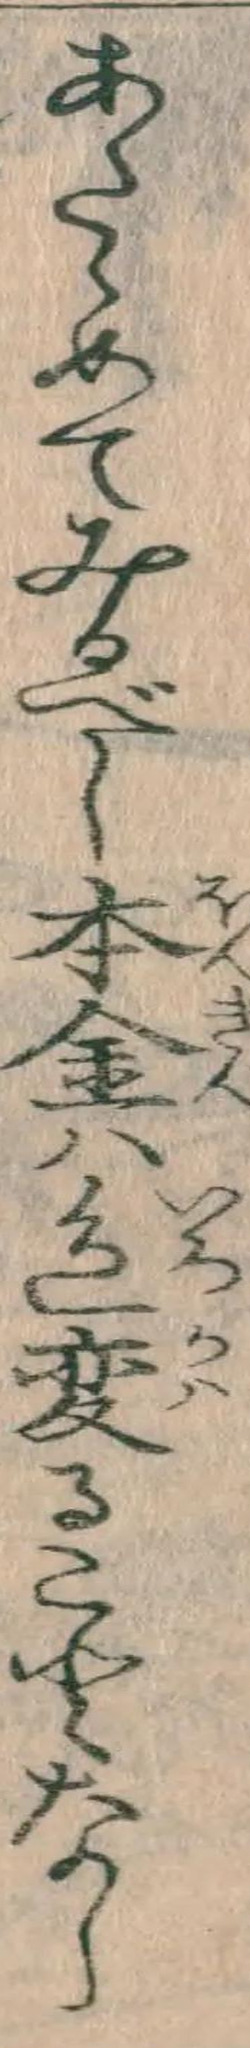あたゝめてみるべし本金は色変ることなし
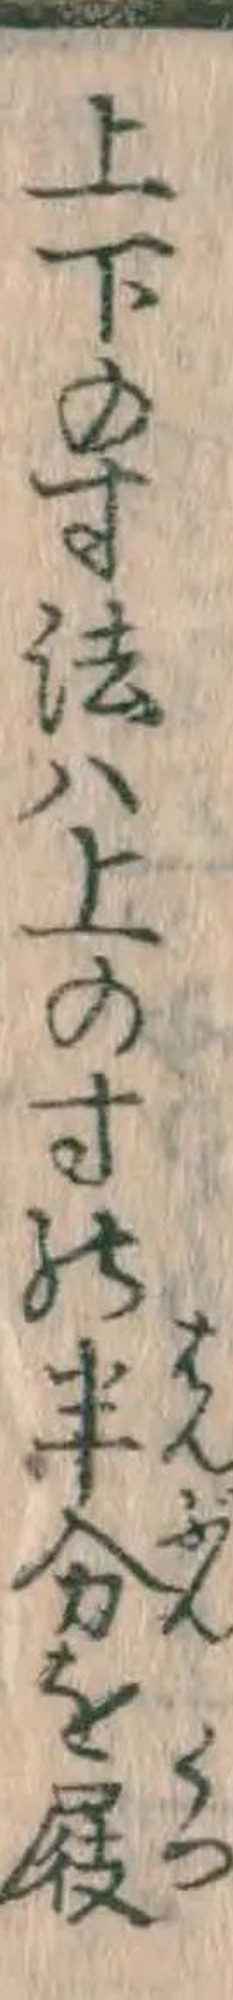上下の寸法は上の寸の半分を履
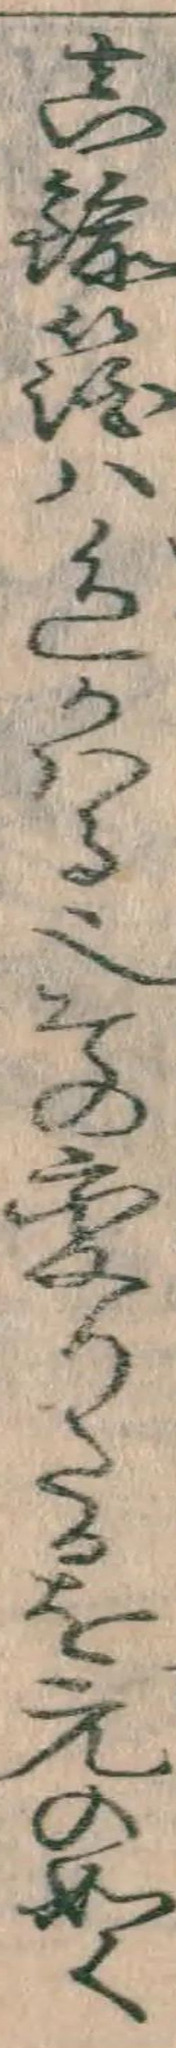真鍮箔は色かはる也その変りたるを元の如く
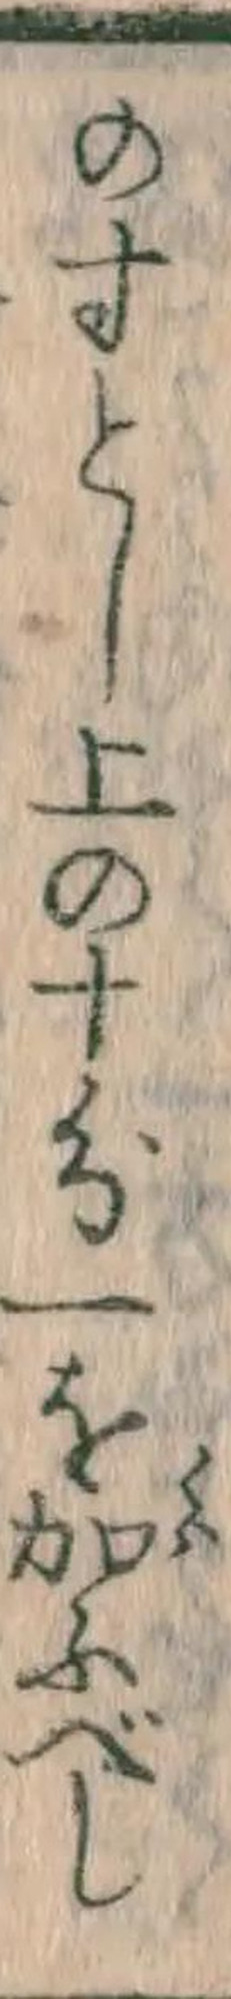の寸とし上の十分一を加ふべし
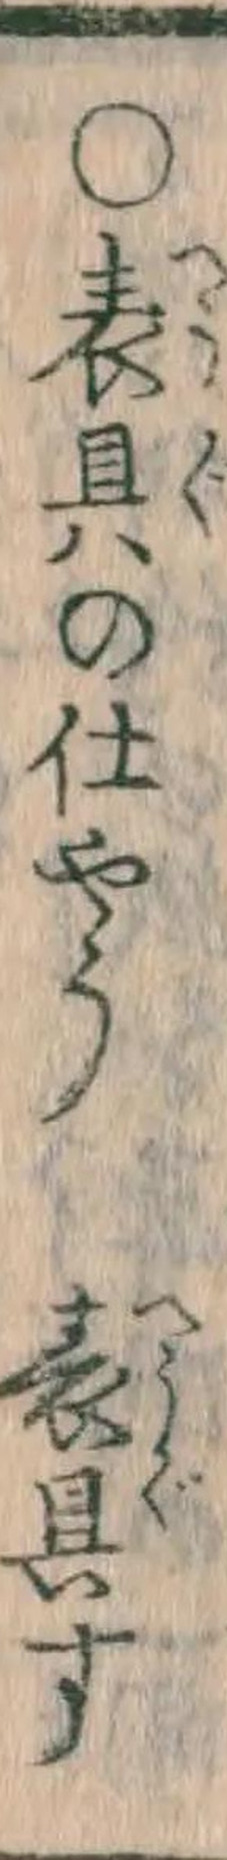○表具の仕やう表具す
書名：広益秘事大全 3巻. [2]
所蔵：国立国会図書館 National Diet Library, JAPAN
